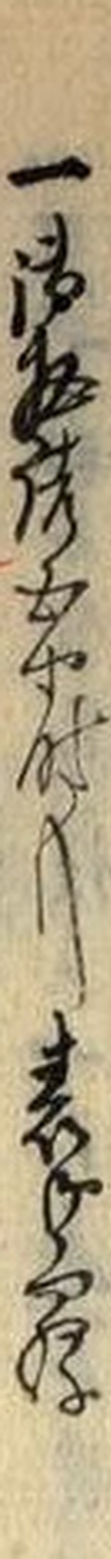一御夜詰五半時引表御寝
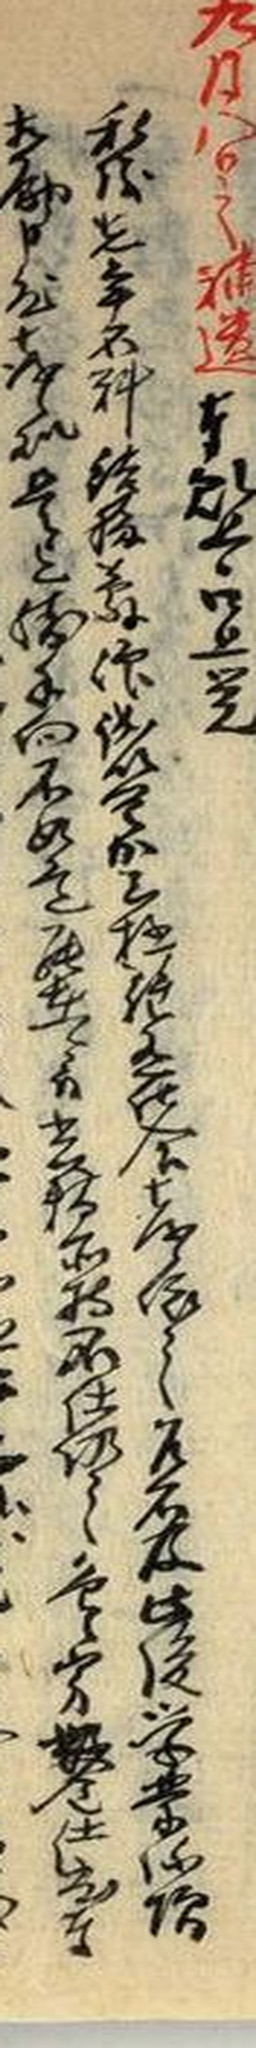相励申度奉存候処是迄勝手向不如意罷在候ニ付書籍所持不仕仍之色々穿鑿仕度奉
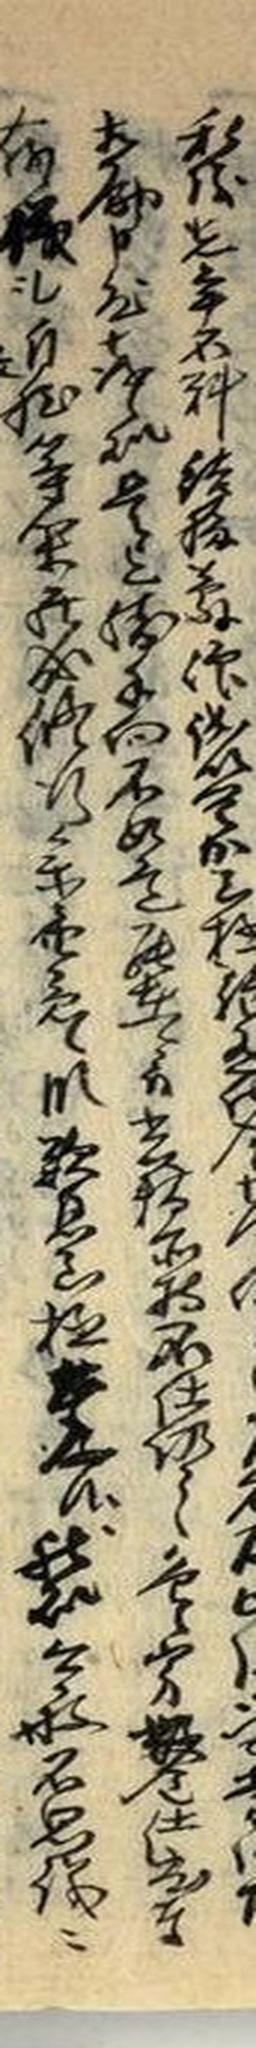存候儀も自然等閑罷成修行参届兼候段嘆息至極奉存候然処今般不思議ニ
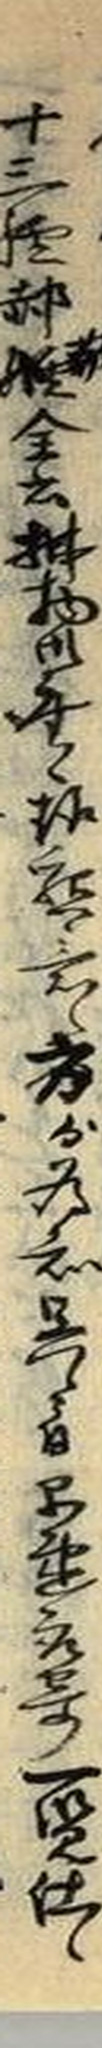十三経郝敬全書払物御座候趣懇意之方ゟ為知呉候ニ付早速取寄一覧仕候
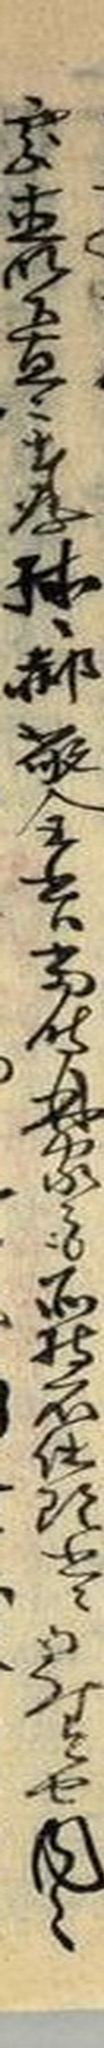処値段下直ニ奉存殊ニ郝敬全書ハ当時林家ニも所持不仕珍書ニ御座候由内々
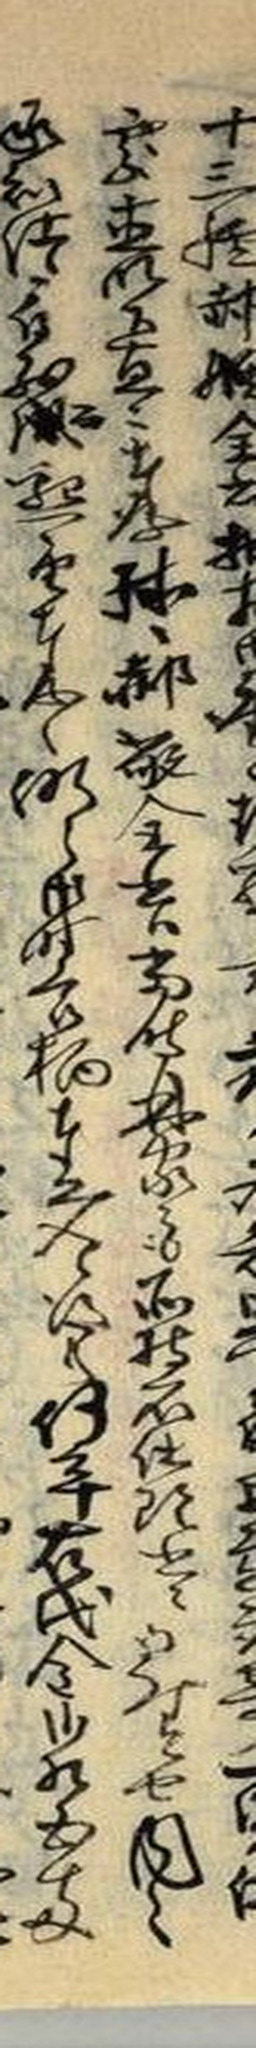承知仕候ニ付別而懇望奉存候仍之御時節柄奉恐入候得共何卒右代金弐拾五両
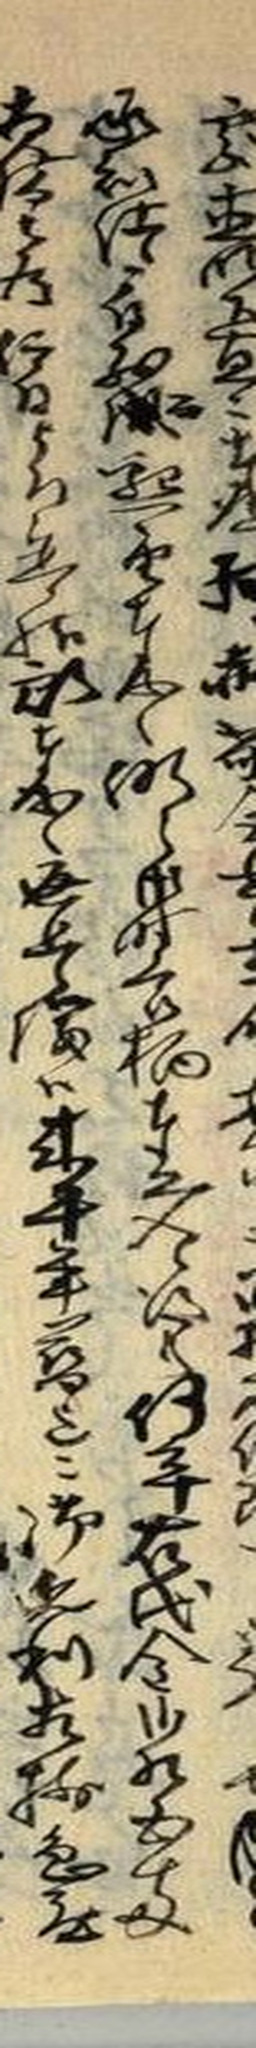拝借被為仰付被下置候様願奉存候返上之儀ハ来午年暮迄ニ御元利相揃急度
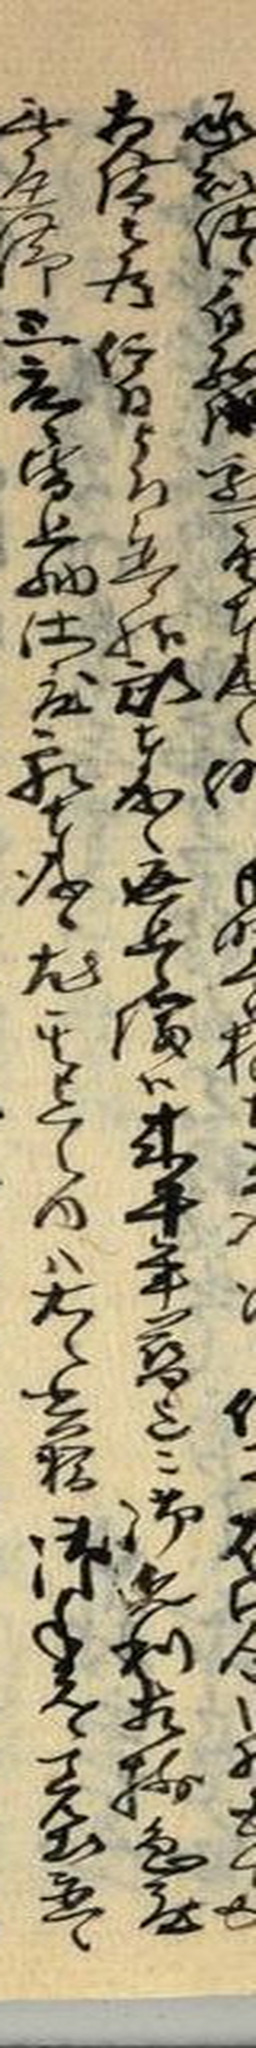無遅滞三度ニ皆上納仕度願奉存候尤其迄之内ハ右之書籍御手元へ差出置候
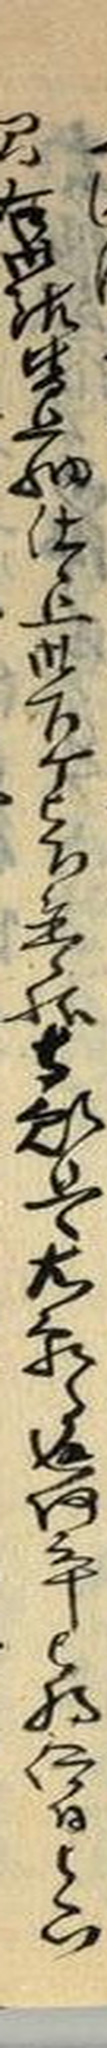間右御銀皆上納仕候上御下ヶ被下置候様奉願上候右願之通何卒被為仰付被下
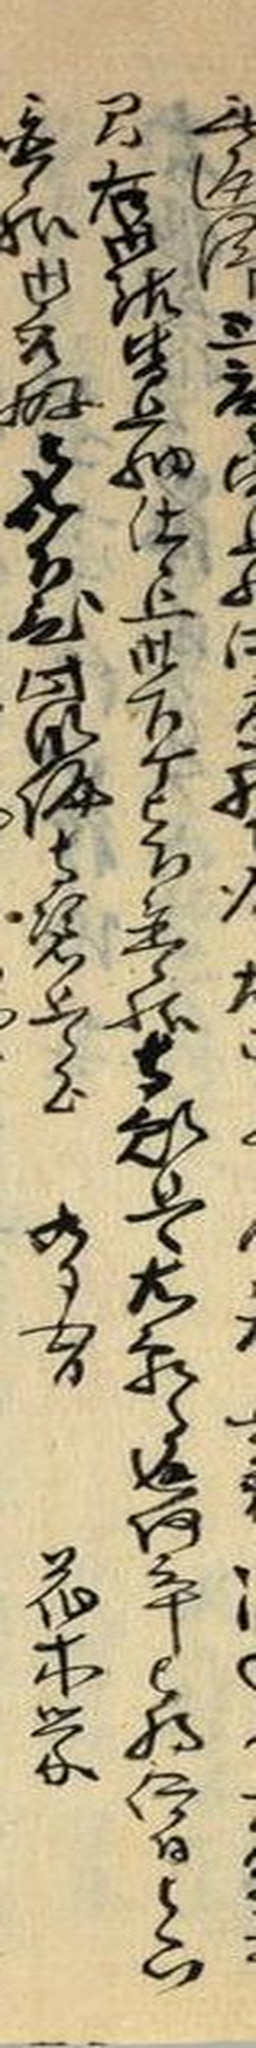置候様御取扱被成下度此段偏奉上候以上九月五日花木栄
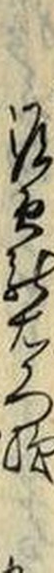渥美新右衛門様
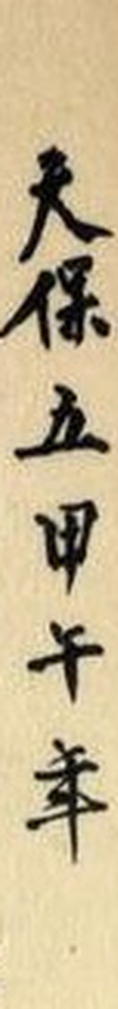天保五甲午年
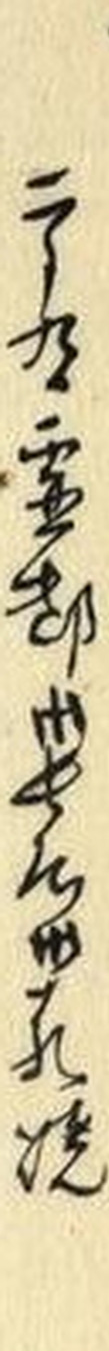二月九日霊邸御長屋御類焼

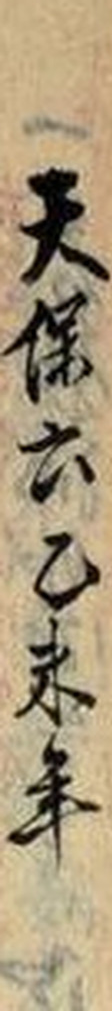天保六乙未年
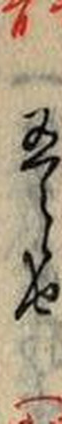有之候由
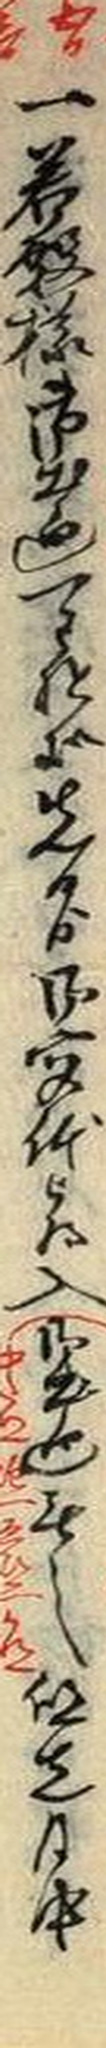一若殿様御出迎可被遊候処先日ゟ御容体被為入御出迎無之但先月中
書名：少傅日録抄（斉承付側向頭取日記、在府）
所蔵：福井県文書館 Fukui Prefectural Archives
